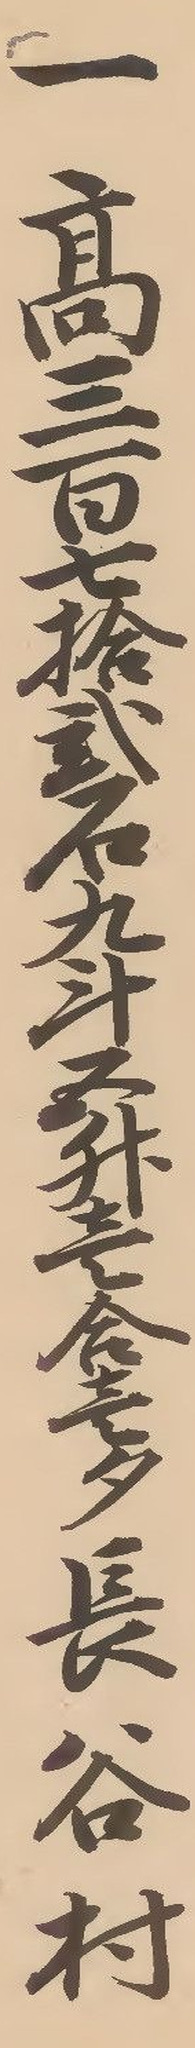一高三百七拾弐石九斗五升壱合壱勺長谷村

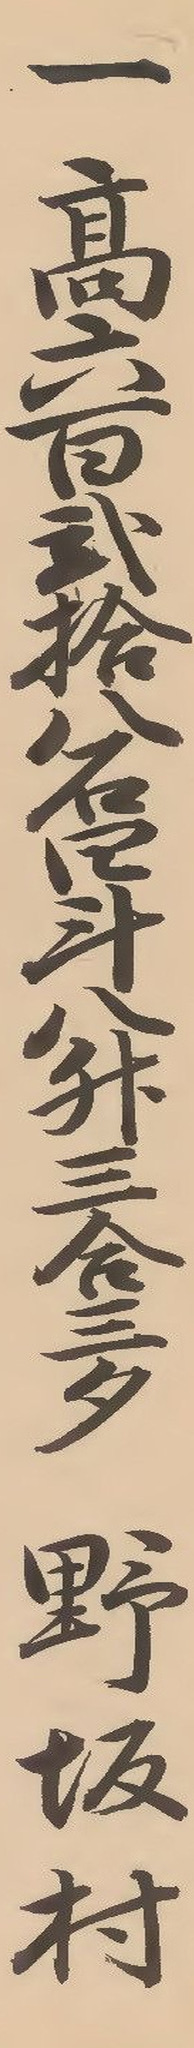一高六百弐拾八石四斗八升三合三勺野坂村
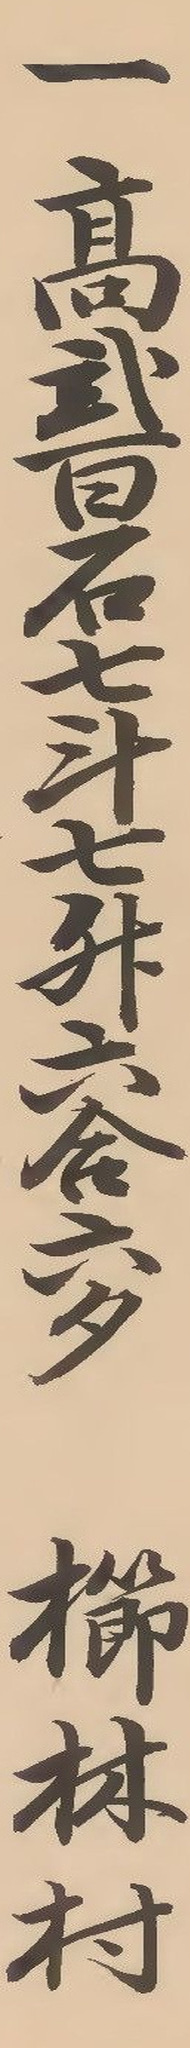一高弐百石七斗七升六合六勺櫛林村
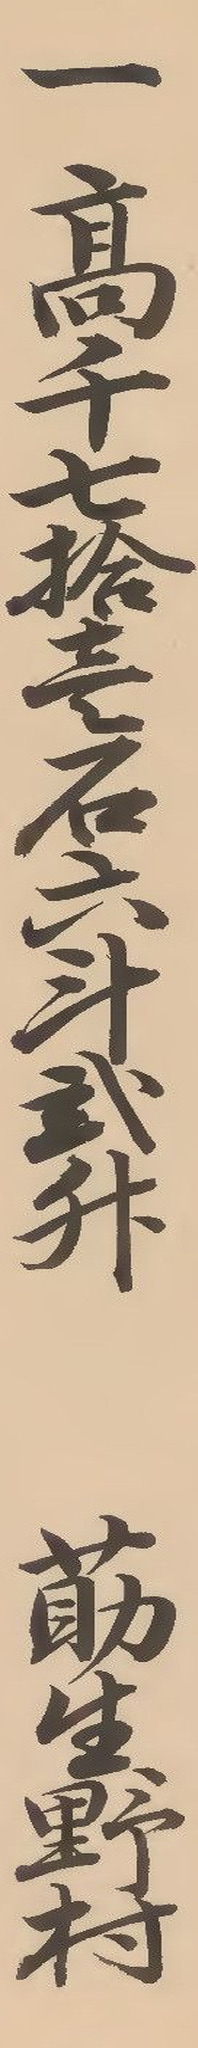一高千七拾壱石六斗弐升莇生野村
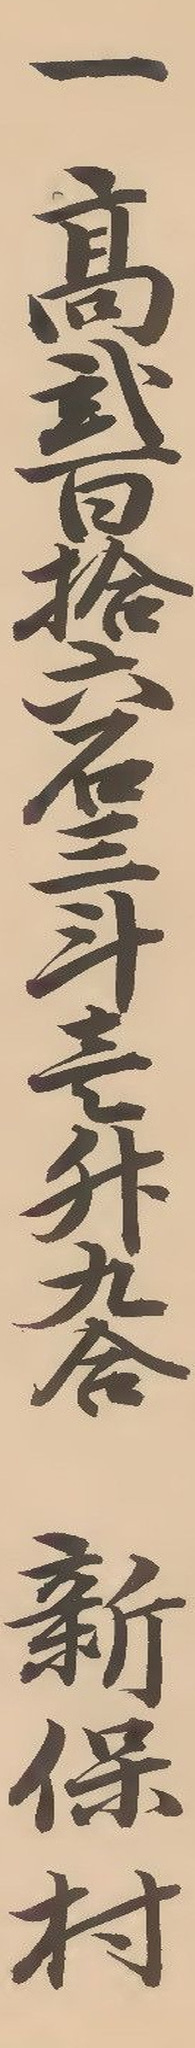一高弐百拾六石三斗壱升九合新保村
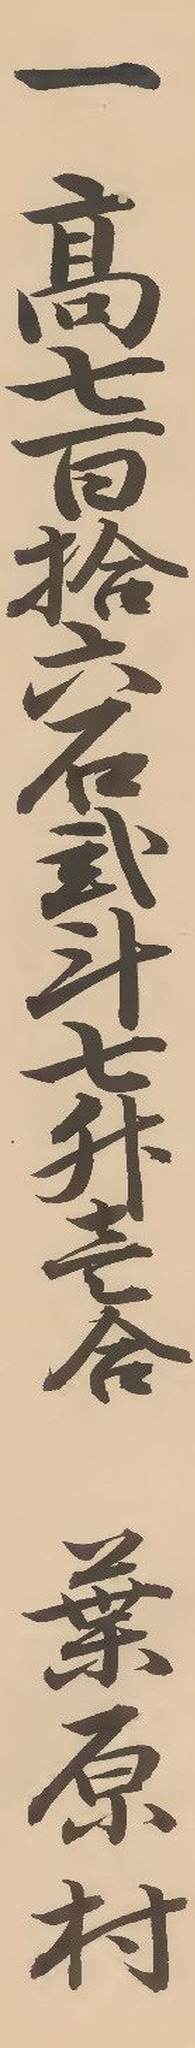一高七百拾六石弐斗七升壱合葉原村
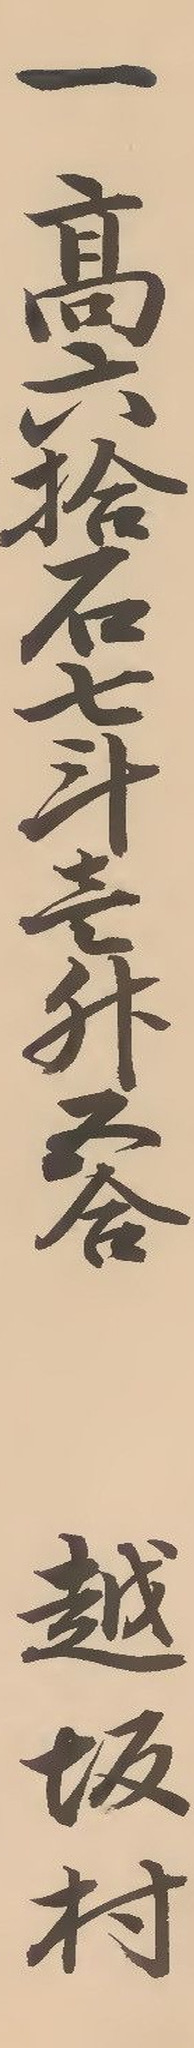一高六拾石七斗壱升五合越坂村
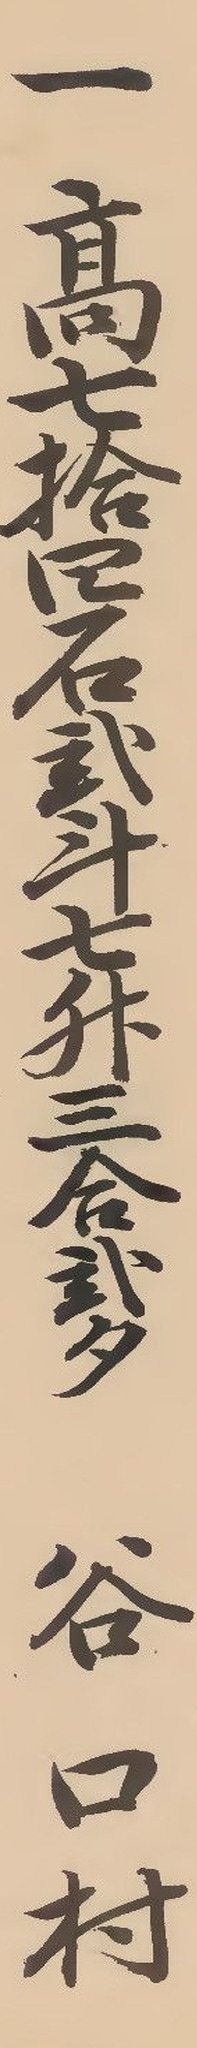一高七拾四石弐斗七升三合弐勺谷口村
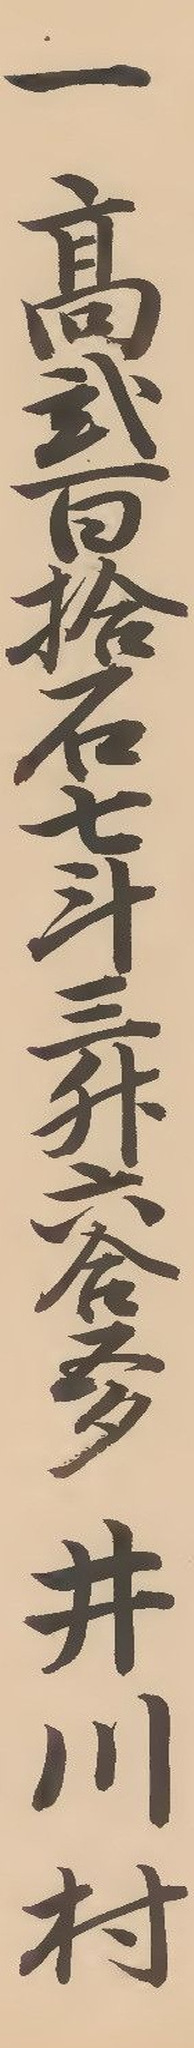一高弐百拾石七斗三升六合五勺井川村

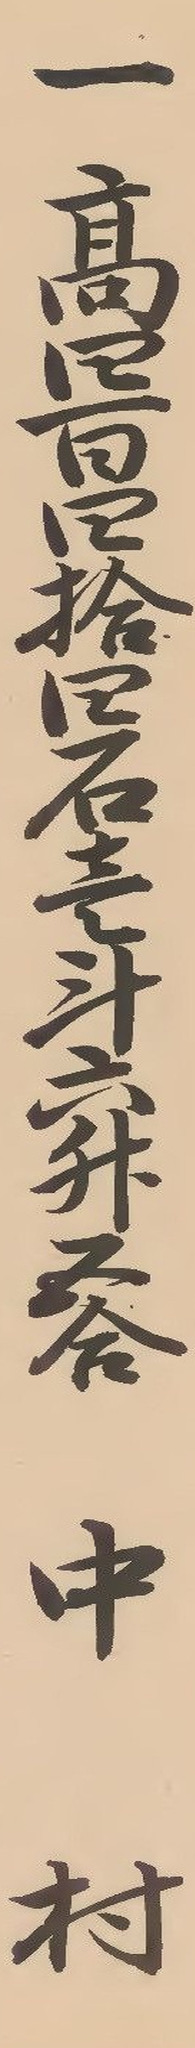一高四百四拾四石壱斗六升五合中村
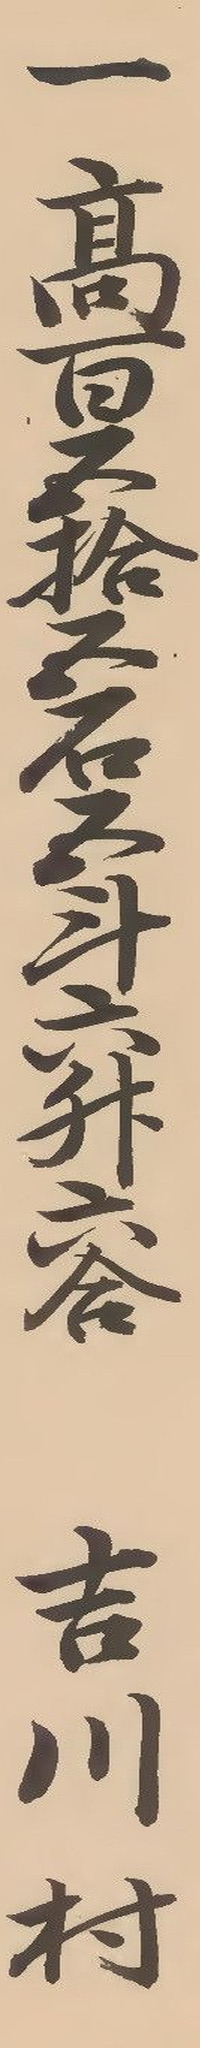一高百五拾五石五斗六升六合吉川村
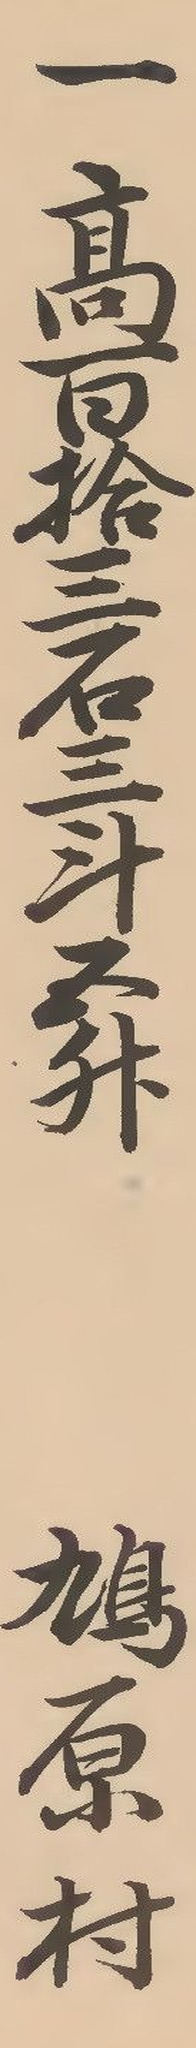一高百拾三石三斗五升鳩原村
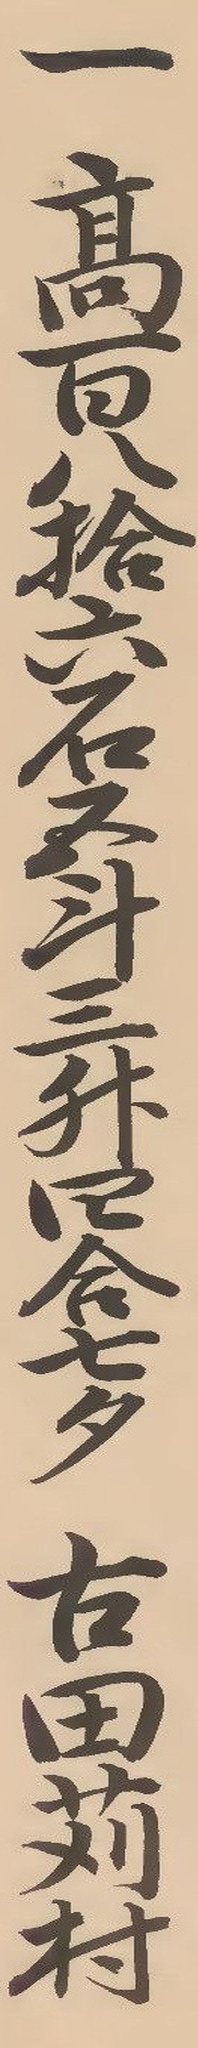一高百八拾六石五斗三升四合七勺古田苅村
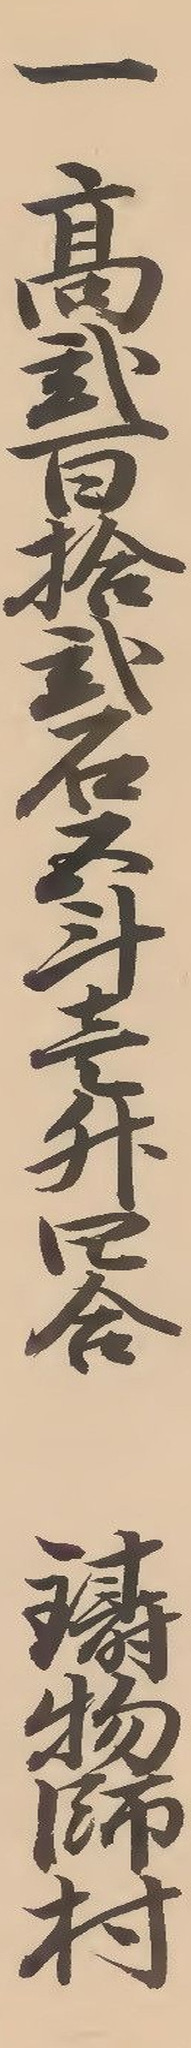一高弐百拾弐石五斗壱升四合鋳物師村
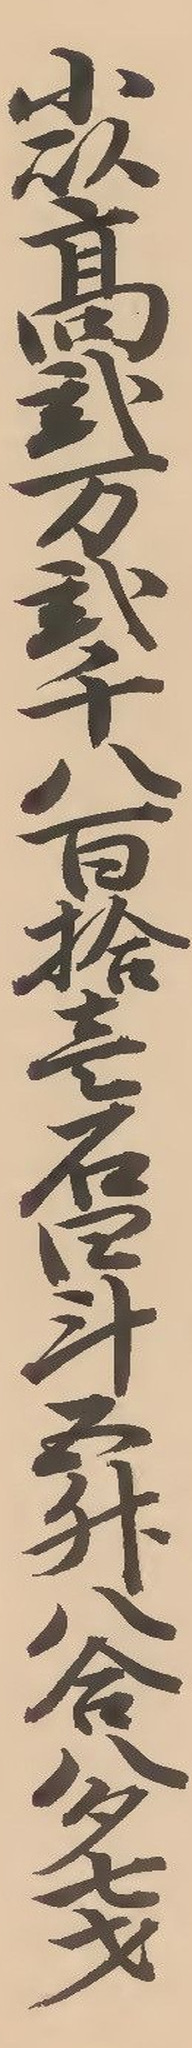小以高弐万弐千八百拾壱石四斗五升八合八勺七才

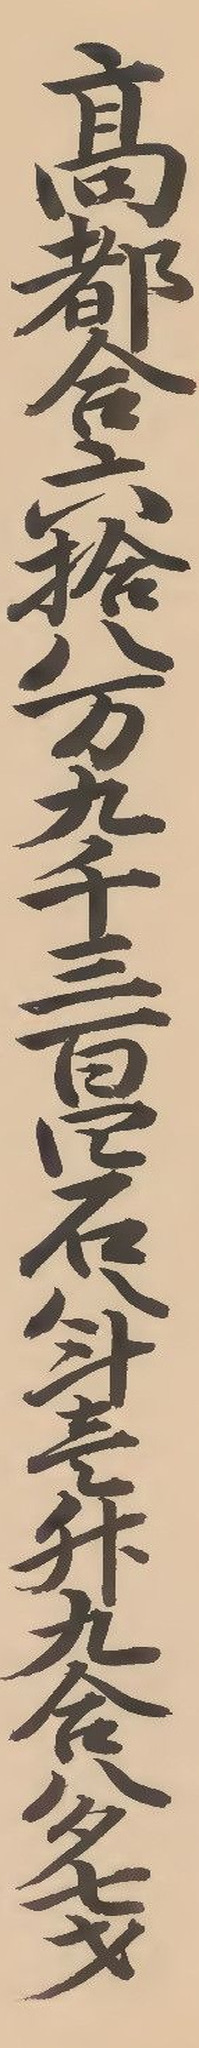高都合六拾八万九千三百四石八斗壱升九合八勺七才
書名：越前国郷帳
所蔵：国立公文書館 National Archives of Japan
